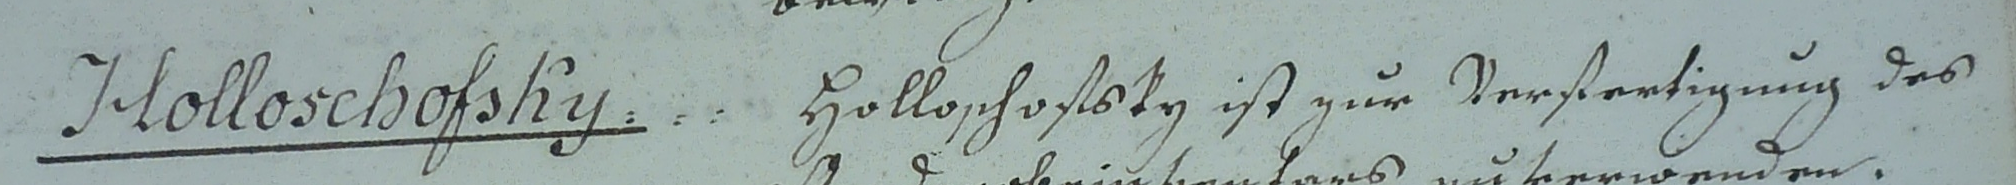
Holloschofsky : : : Holloschofsky ist zur Verfertigung des
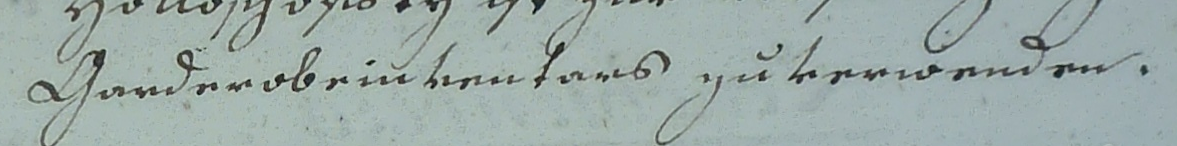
Garderobeinventars zuverwenden.
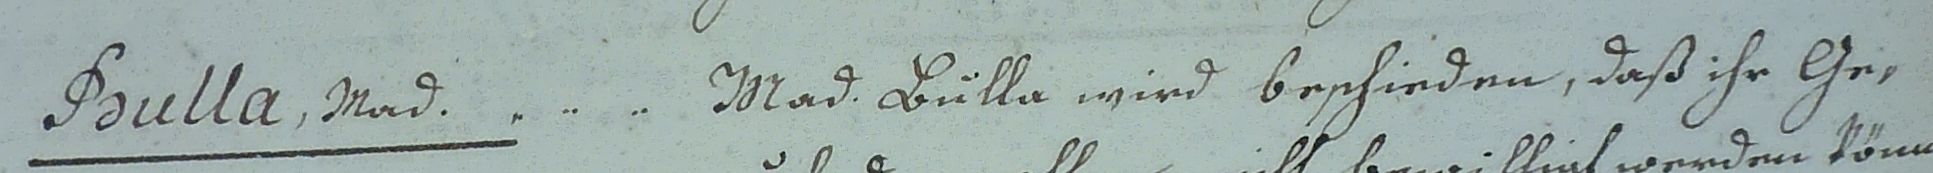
Bulla, Mad. . .. .. Mad. Bulla wird beschieden, daß ihr Ge¬
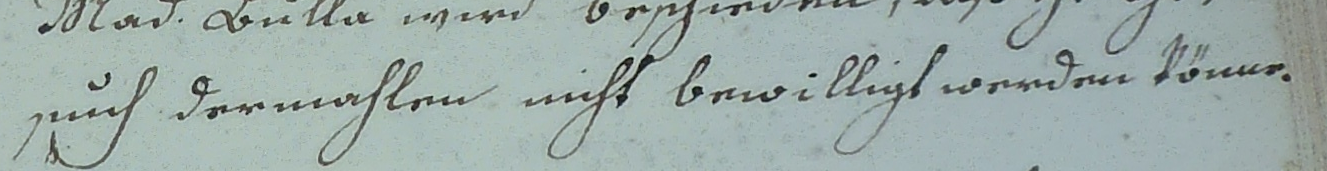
such dermahlen nicht bewilligt werden könne.
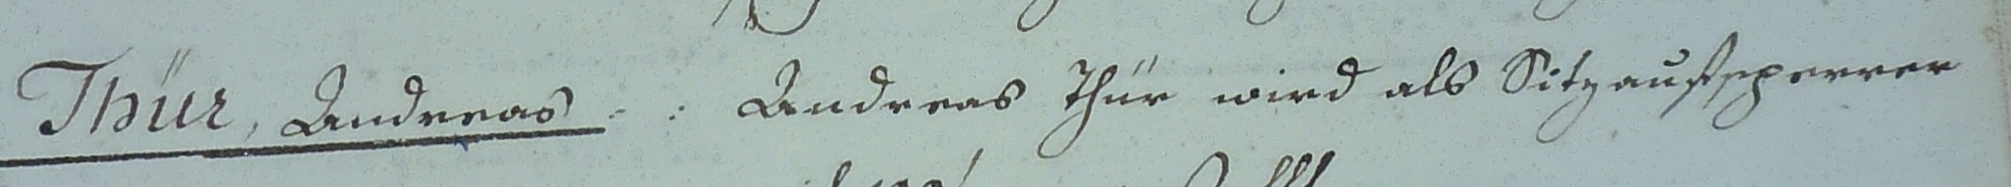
Thür, Andreas : : Andreas Thür wird als Sitzaufsperrer
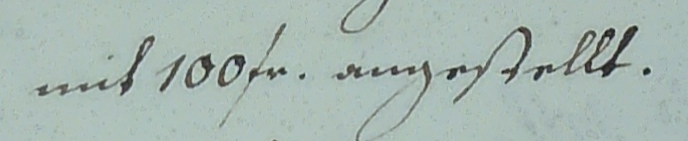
mit 100fr. angestellt.
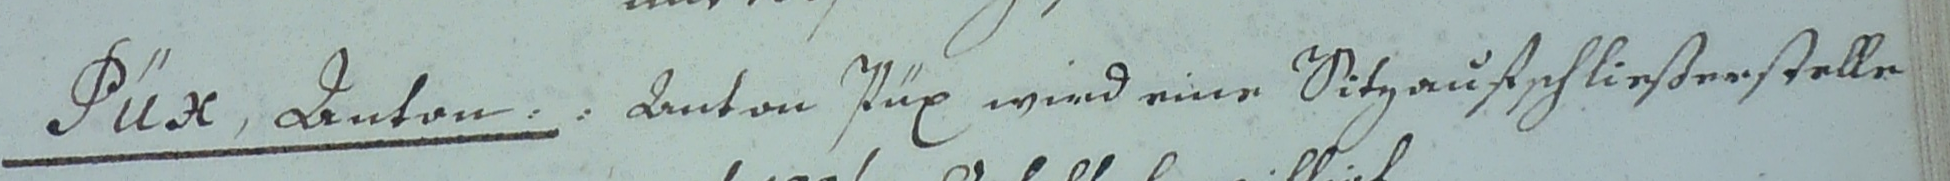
Püx, Anton : : Anton Püx wird eine Sitzaufschließerstelle
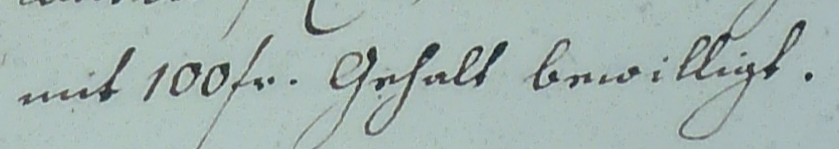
mit 100fr. Gehalt bewilligt.
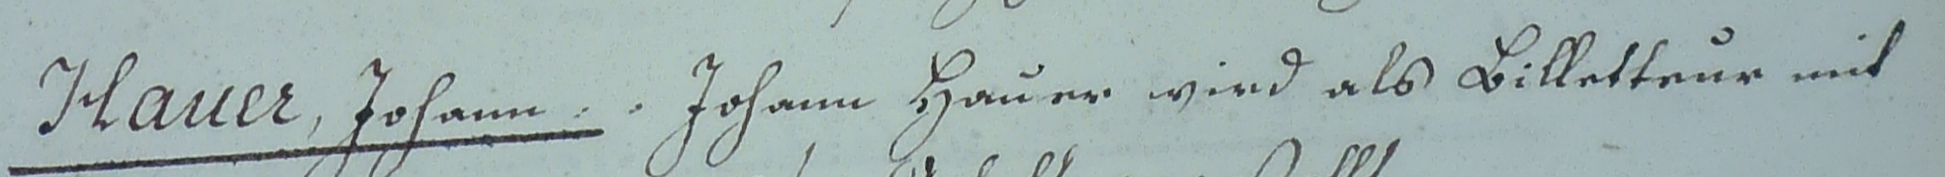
Hauer, Johann : : Johann Hauer wird als Billetteur mit
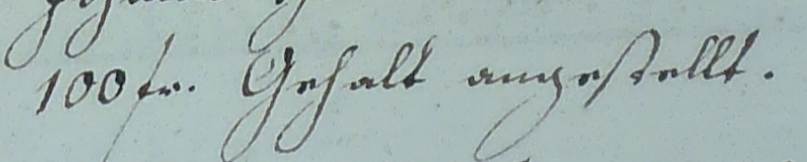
100 fr. Gehalt angestellt.
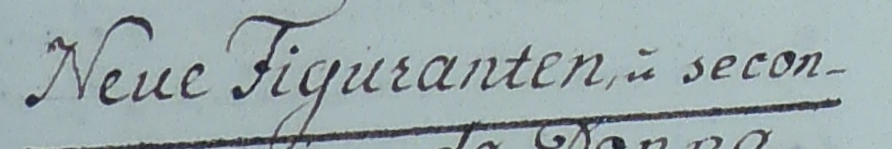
Neue Figuranten, u secon‒
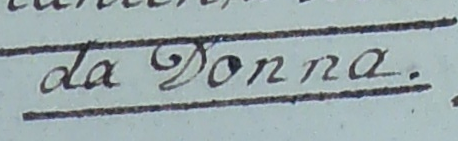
da Donna.
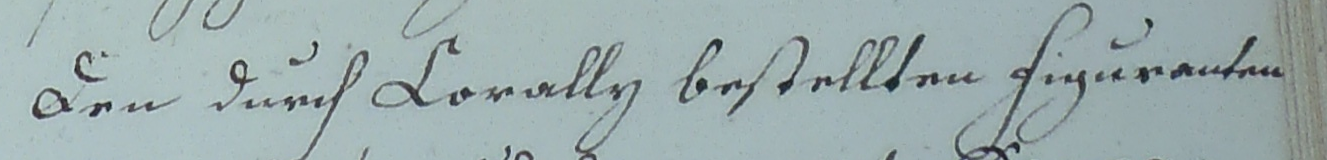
Den durch Corally bestellten Figuranten
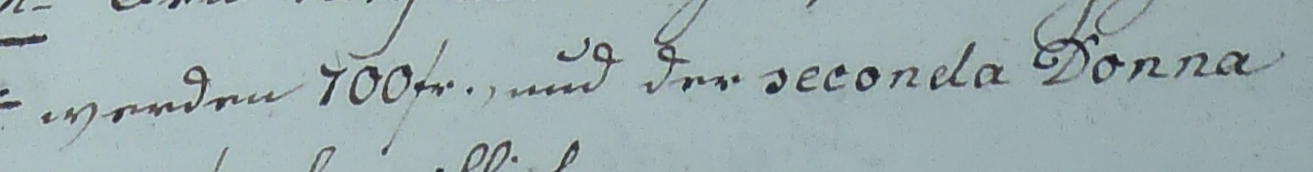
werden 700fr., und der seconda Donna
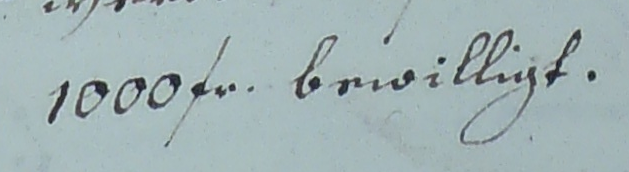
1000 fr. bewilligt.
